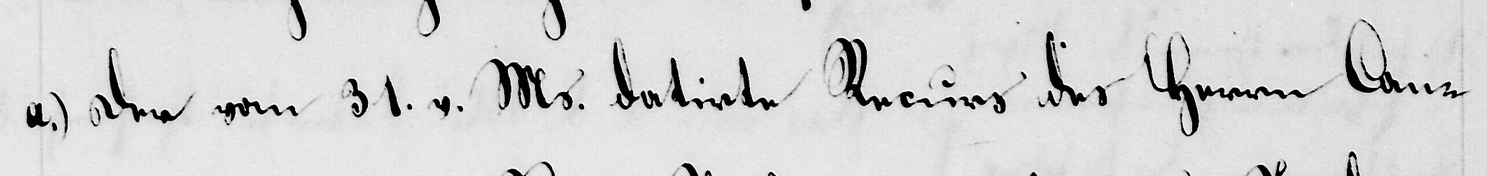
a.) Der vom 31. v. Ms. datirte Recurs des Herrn Can¬
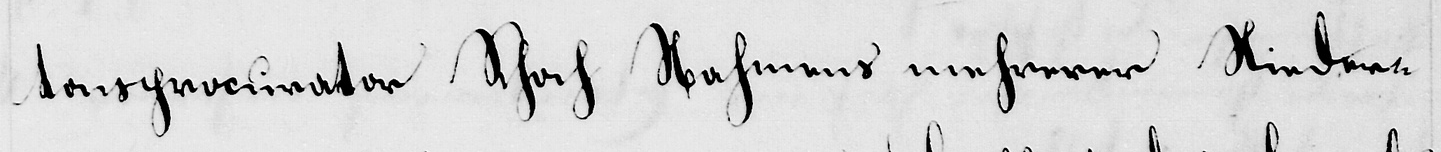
tonsprocurator Schoch Nahmens mehrerer Nieder¬
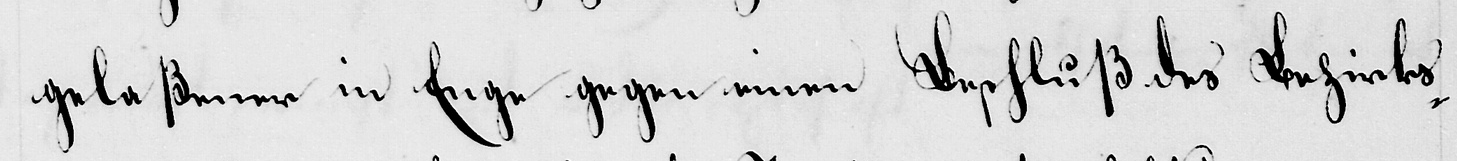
gelaßener in Enge gegen einen Beschluß des Bezirks¬
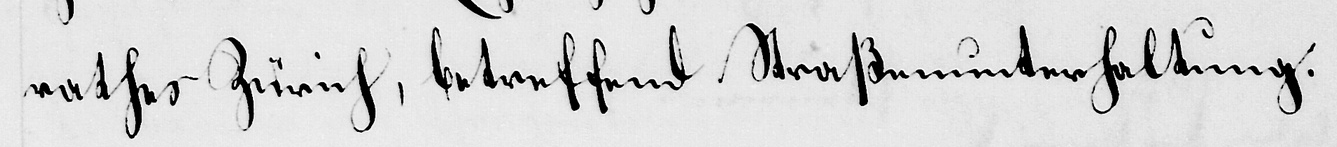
rathes Zürich, betreffend Straßenunterhaltung.
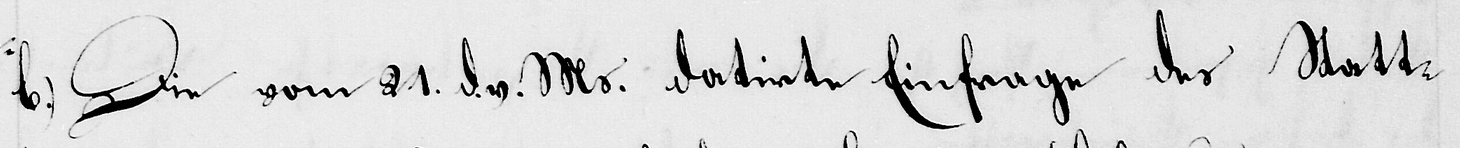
b.) Die vom 21. d. v. Ms. datirte Einfrage des Statt¬
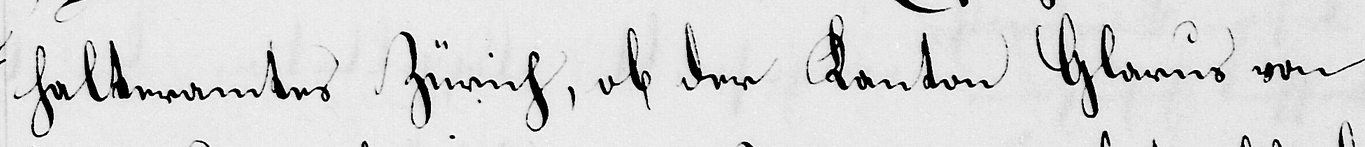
halteramtes Zürich, ob der Kanton Glarus von
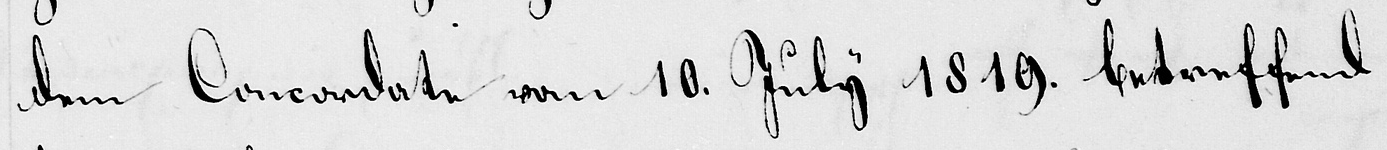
dem Concordate vom 10. July 1819. betreffend
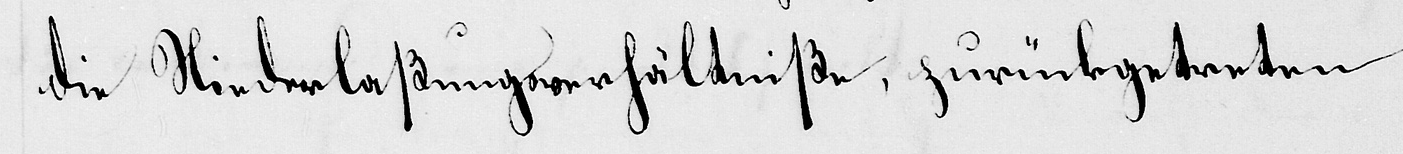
die Niederlaßungsverhältniße, zurückgetreten
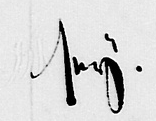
sey.
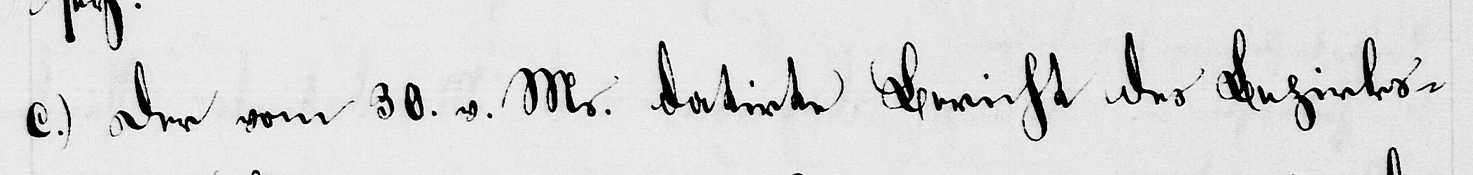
c.) Der vom 30. v. Ms. datirte Bericht des Bezirks¬
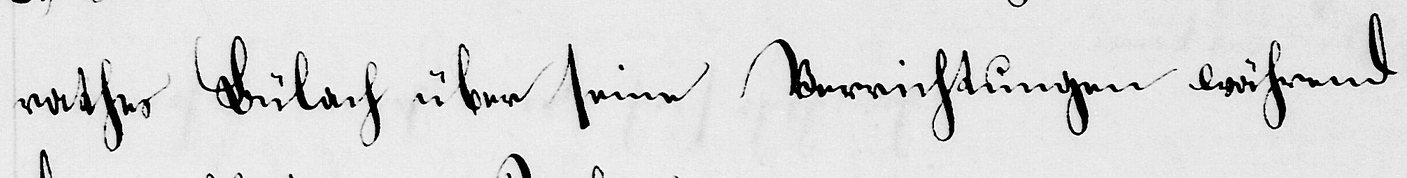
rathes Bülach über seine Verrichtungen während
